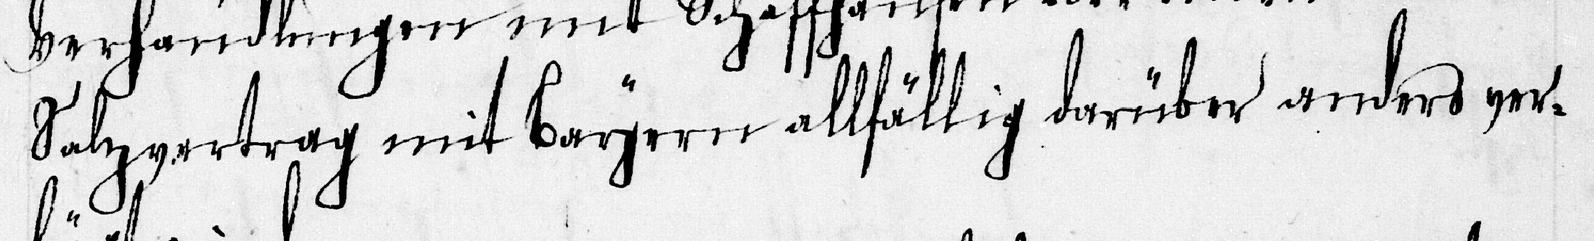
Salzvertrag mit Bayern allfällig darüber anders ver¬
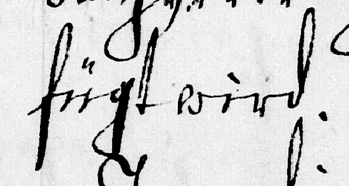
fügt wird.
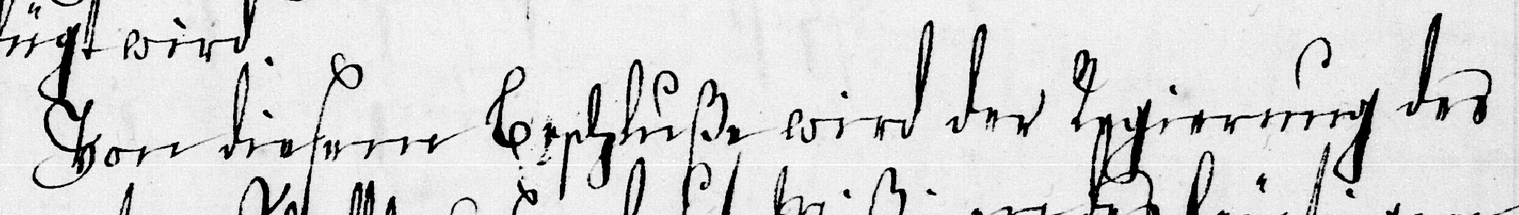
Von diesem Beschluße wird der Regierung des
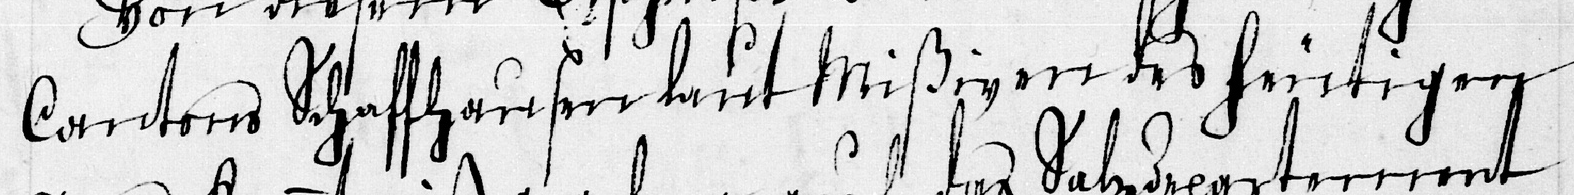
Cantons Schaffhausen laut Mißiven des heutigen
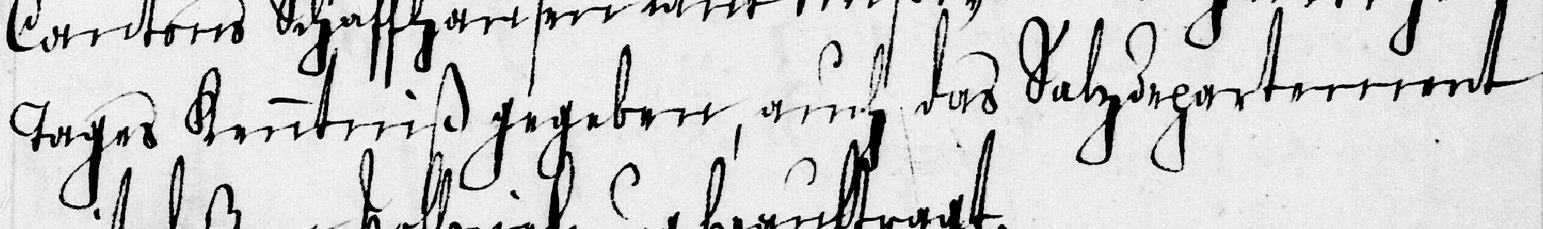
Tages Kenntniß gegeben, auch das Salzdepartement
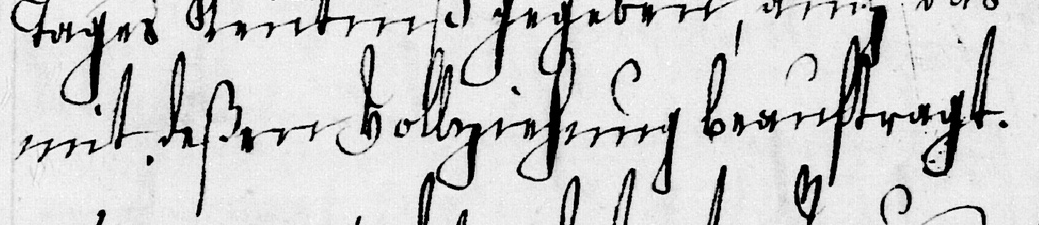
mit deßen Vollziehung beauftragt.
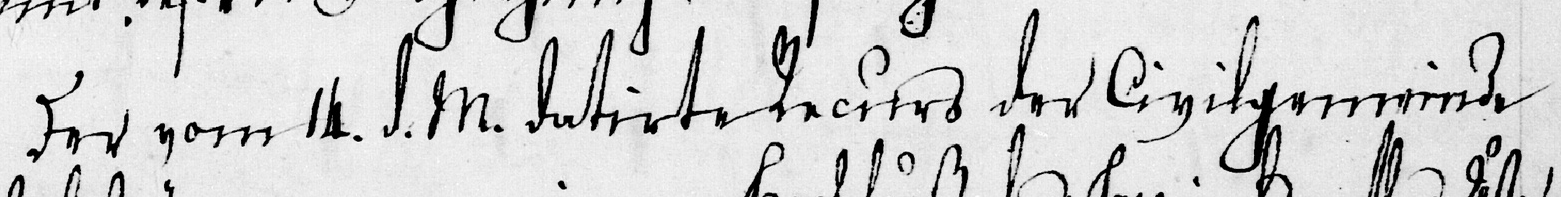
Der vom 14. d. M. datirte Recurs der Civilgemeinde
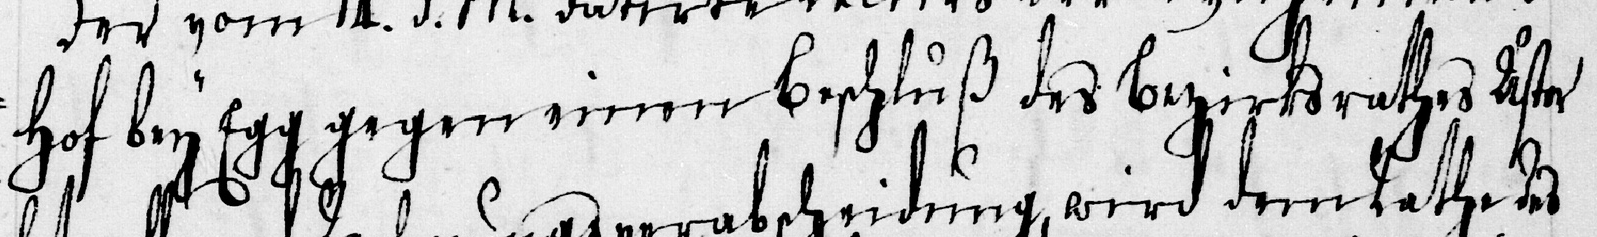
Hof bey Egg gegen einen Beschluß des Bezirksrathes Uster
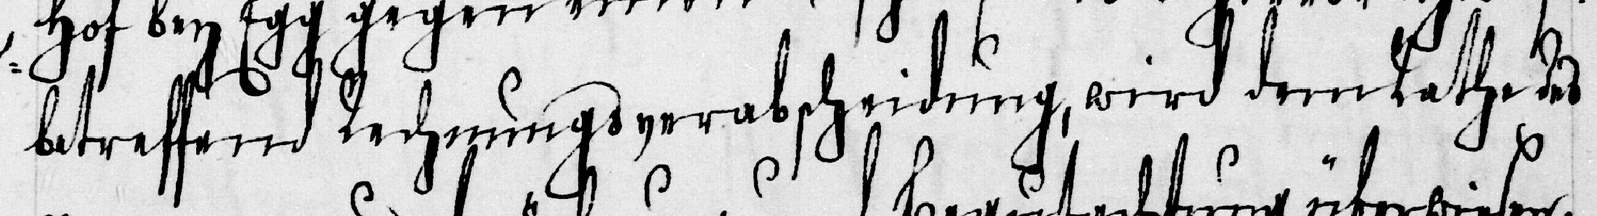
betreffend Rechnungsverabscheidung, wird dem Rathe des
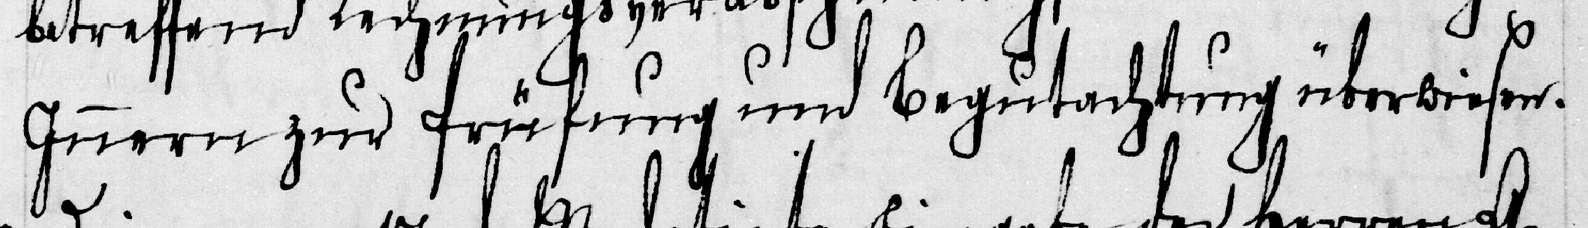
Innern zur Prüfung und Begutachtung überwiesen.
